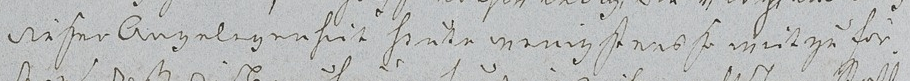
dieser Angelegenheit heute wenigstens so weit zu för-
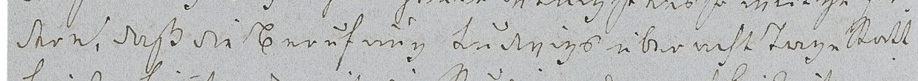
dern, daß die Berufung Ludwigs über acht Tage Statt
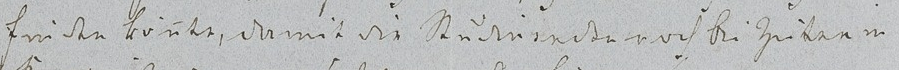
finden könnte, damit die Studirenden noch bei Zeiten in
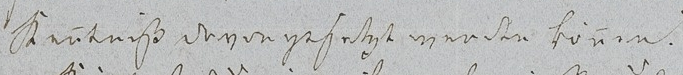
Kenntniß davon gesetzt werden können.
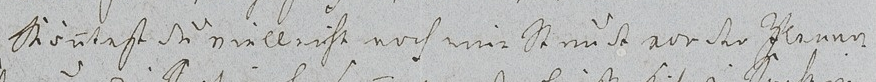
Könntest du vielleicht noch eine Stunde vor der Plenar-
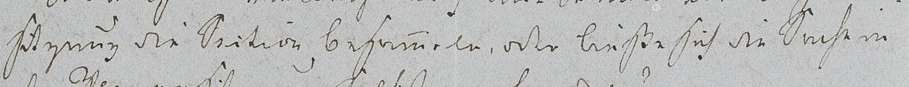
sitzung die Section besammeln, oder ließe sich die Sache in
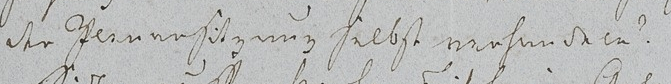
der Plenarsitzung selbst verhandeln?
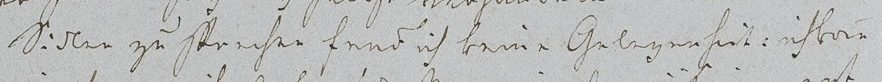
Sidler zu sprechen fand ich keine Gelegenheit: ich kann
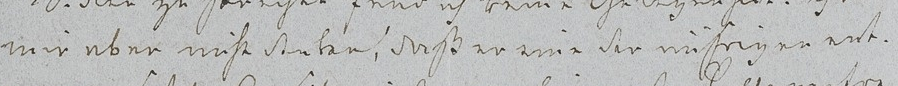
mir aber nicht denken, daß er eine der unsrigen ent-
